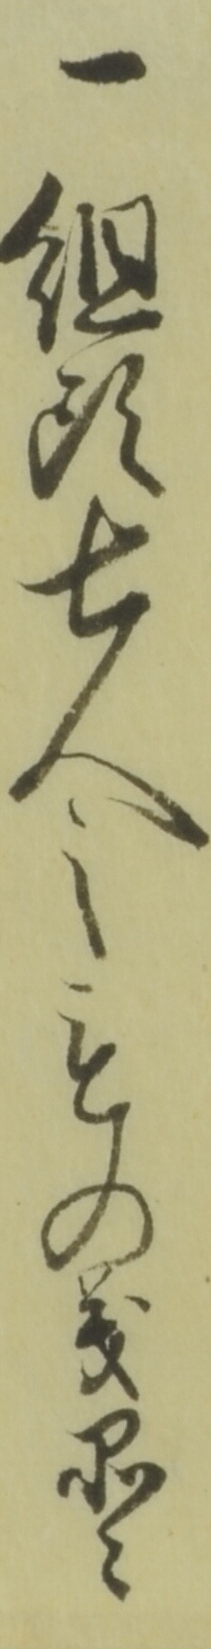一組頭七人之もの義品々
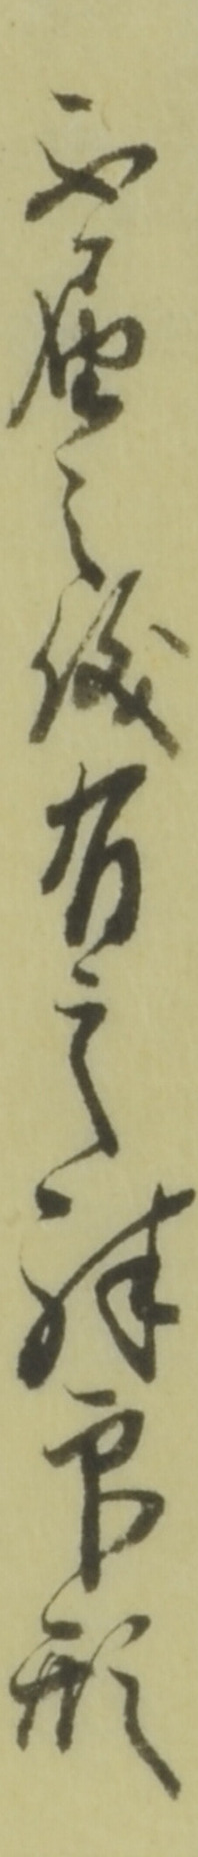不届之儀有之封印形
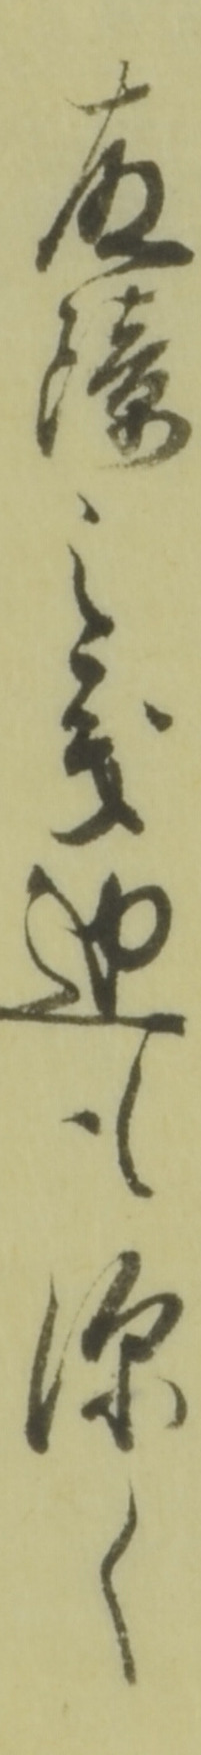故障之義迚も深く
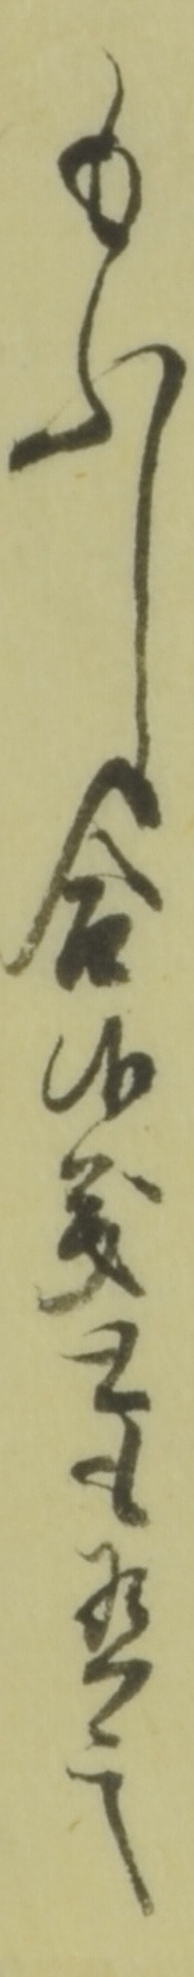もふし金候義とも有之
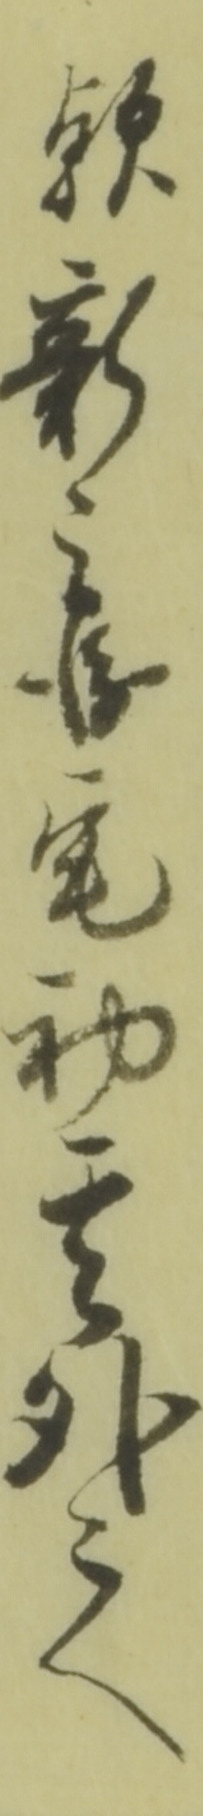欤新兵衛宅初其外て
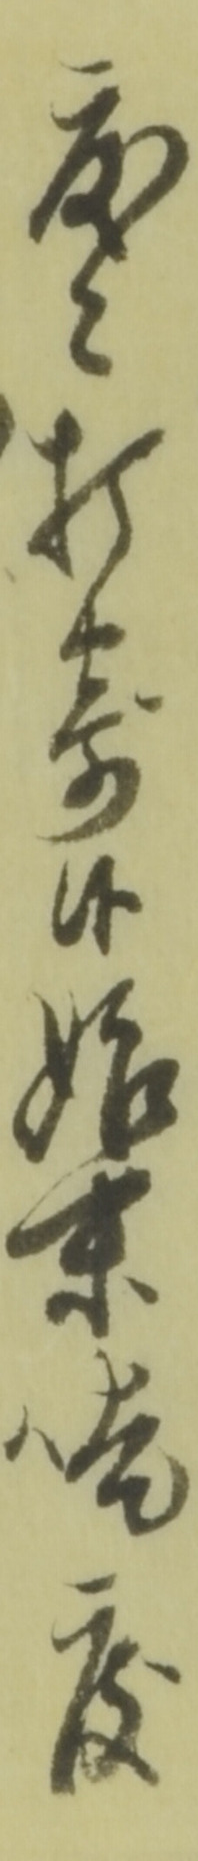度々打寄候始末屹度
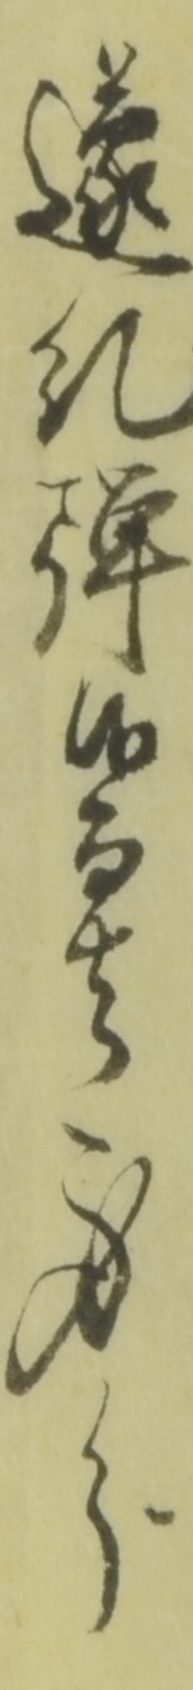遂糺弾候而は身分

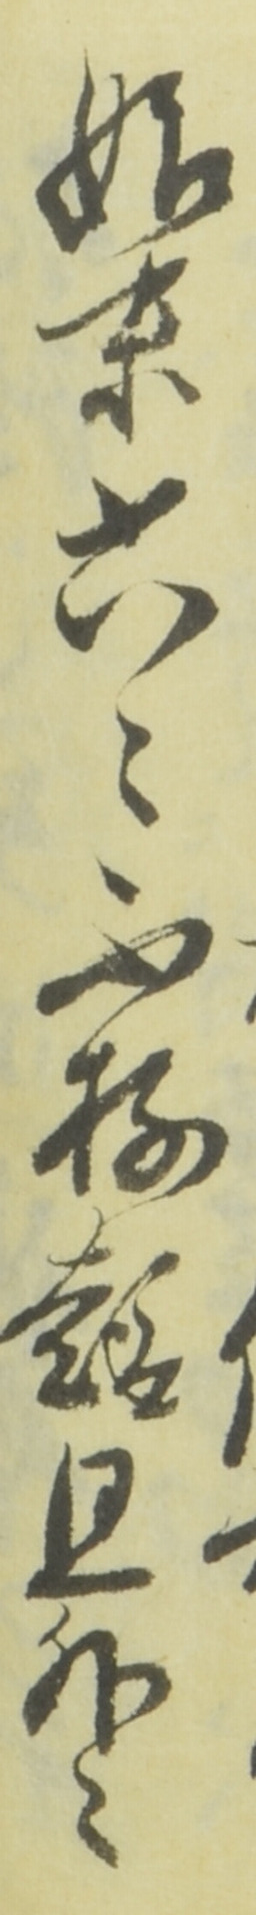始末六々不存趣且且外ニ
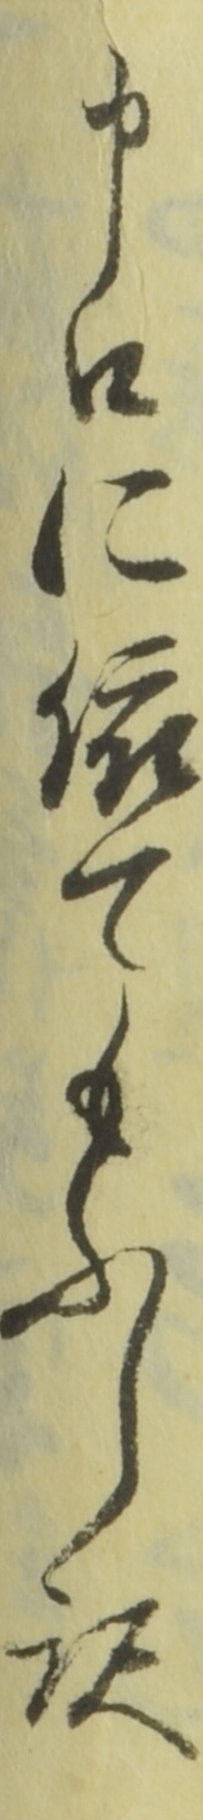申候に依てもふし訳
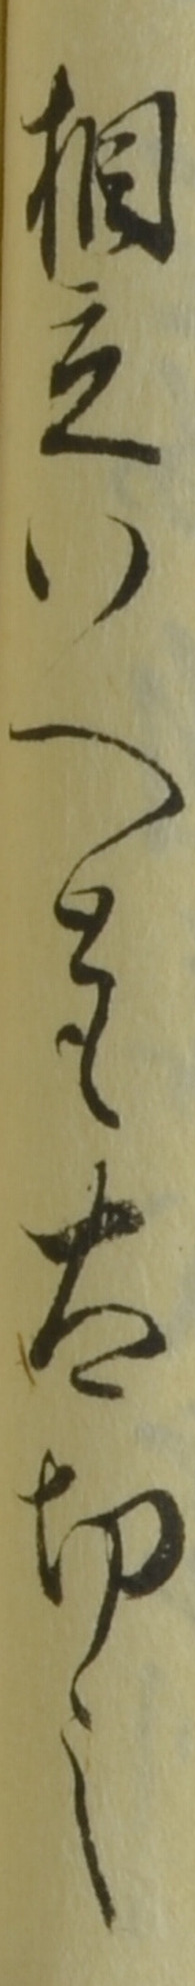相立いへとも太切之
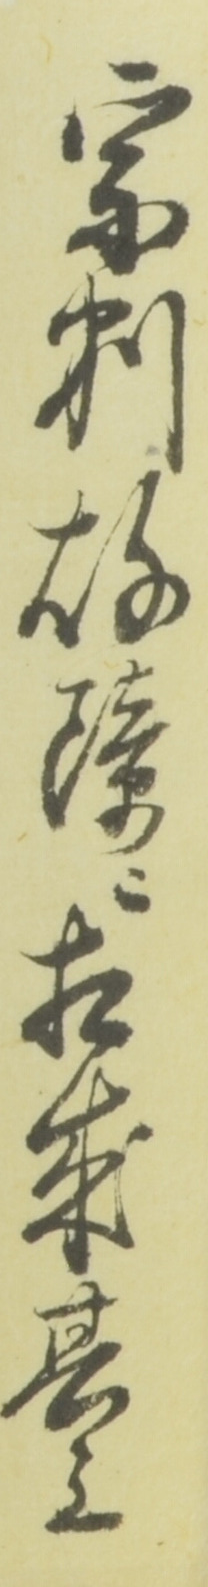宗判故障ニ相成其上
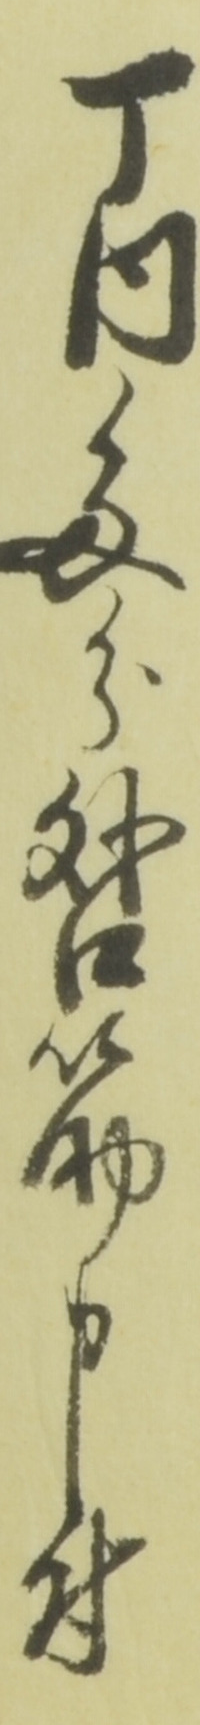丁内多分咎筋申付
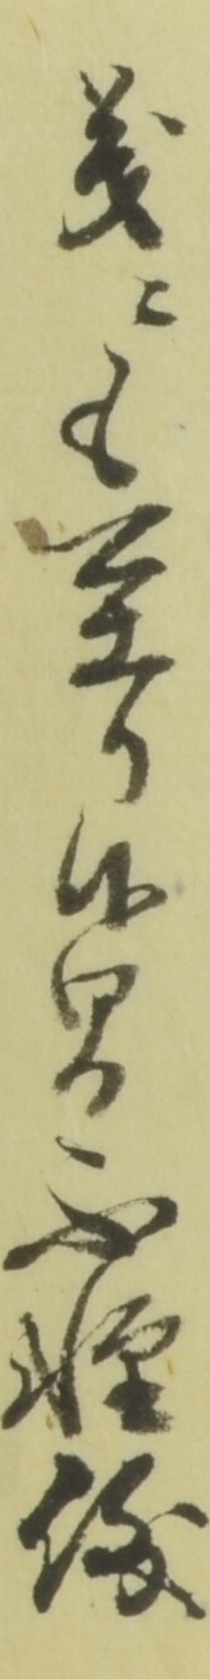義ニも至り候間不軽儀
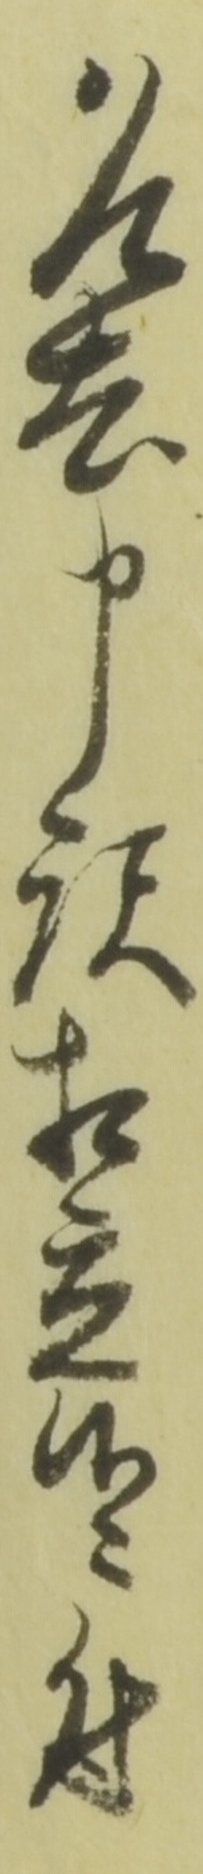乍去申訳相立候ニ付
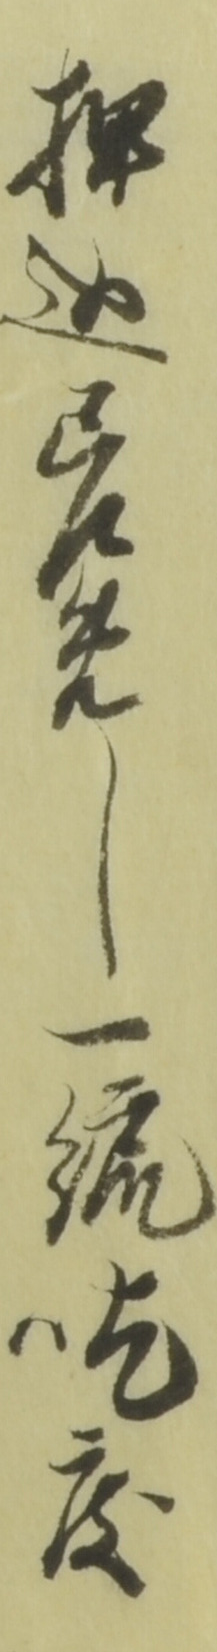押込差免し一統屹度
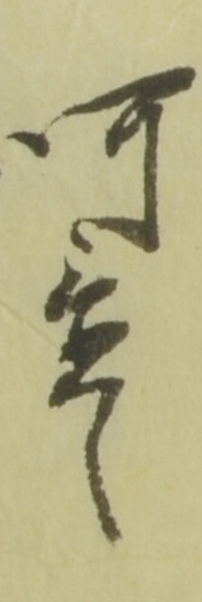呵置候
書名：御触書御書附控
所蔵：伊那市立高遠町図書館・合同会社AMANE
